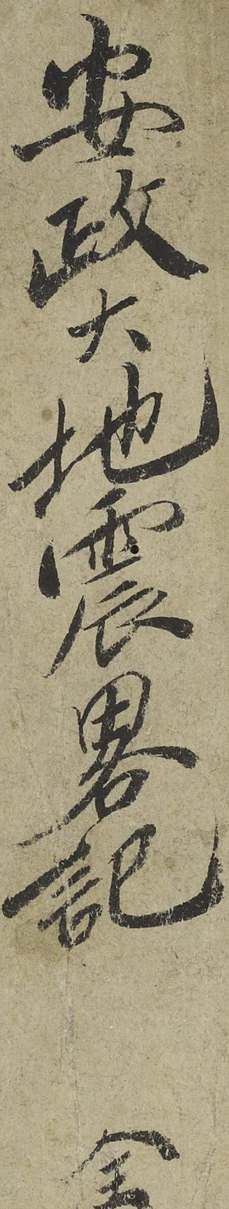安政大地震畧記全

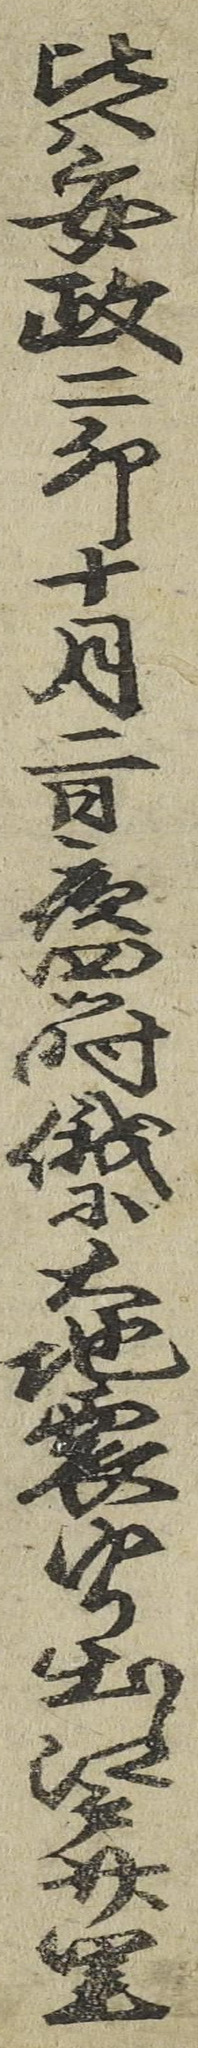比は安政二卯十月二日夜四ッ時俄に大地震ゆり出し江戸并四里
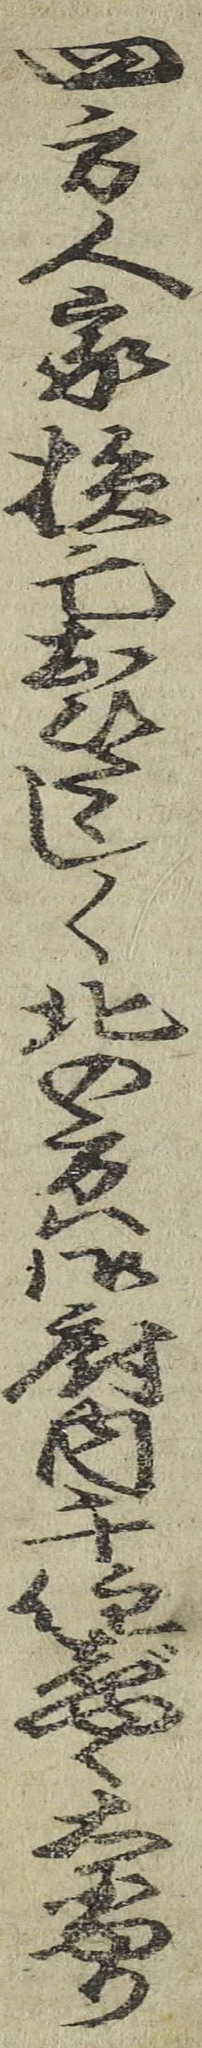四方人家損亡おひたゝしく北の方は御府内千住ぢゆく大にゆり
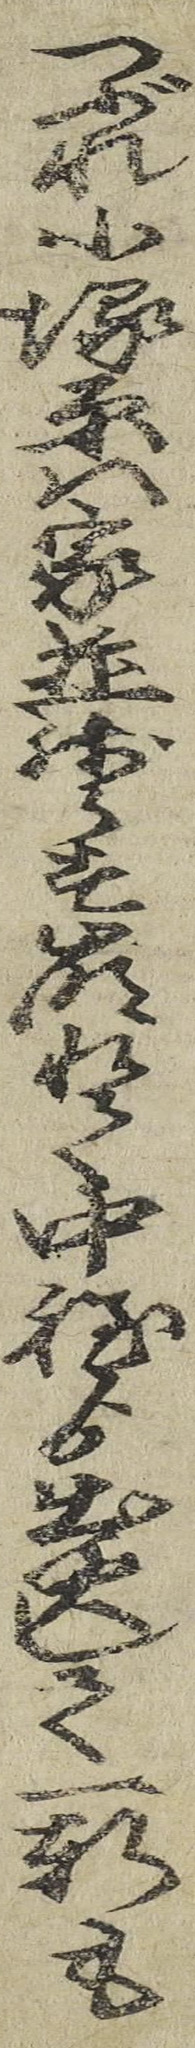つぶれ小塚原は家並残らす崩れて中程ゟ出火して一軒も
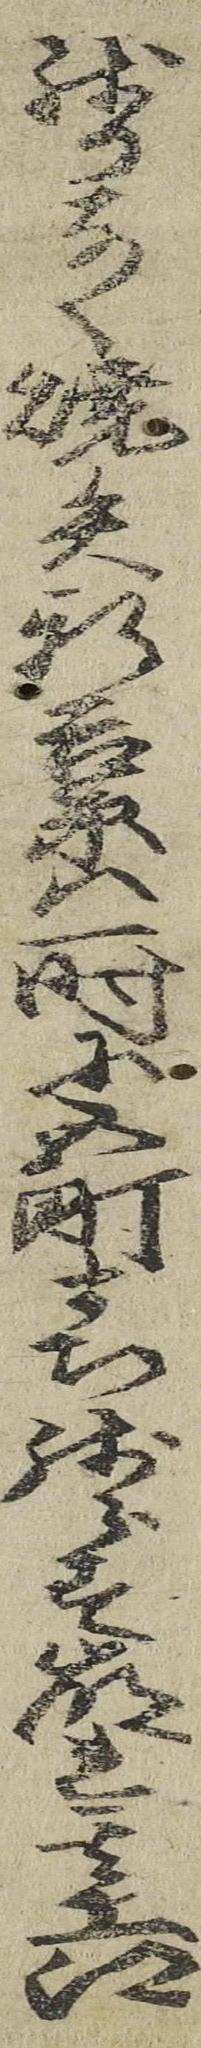残なく焼失新吉原は一時に五町まち残らす崩れ其上江
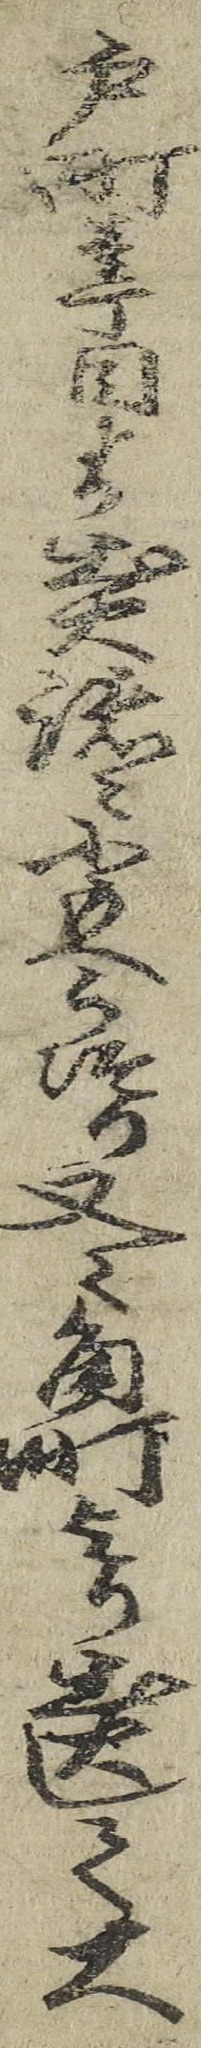戸町壱丁目より出火諸々にもへくはり又々角町より出火して大
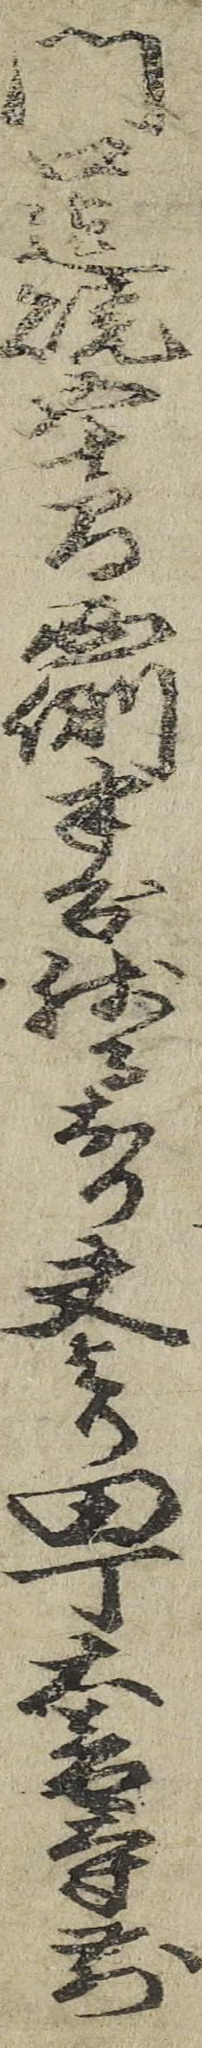門口迄焼五十間西側半分残るなり夫より田丁大音寺前
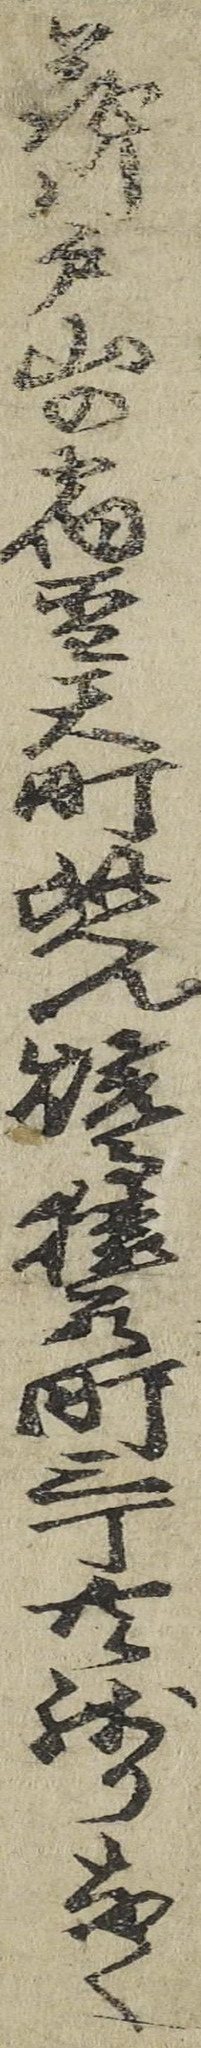花川戸山の宿聖天町此へん焼る猿若町三丁共残りなく
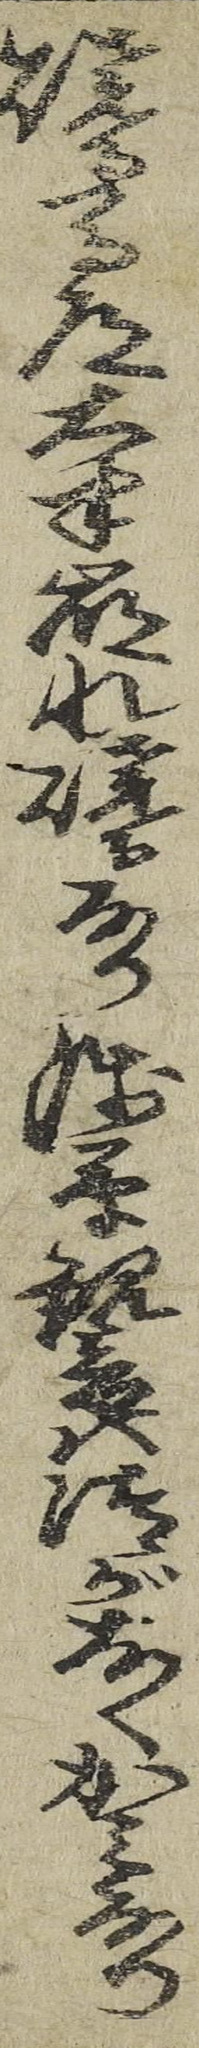焼る馬道大半崩焼るなり浅草観音はつゝがなくかみなり
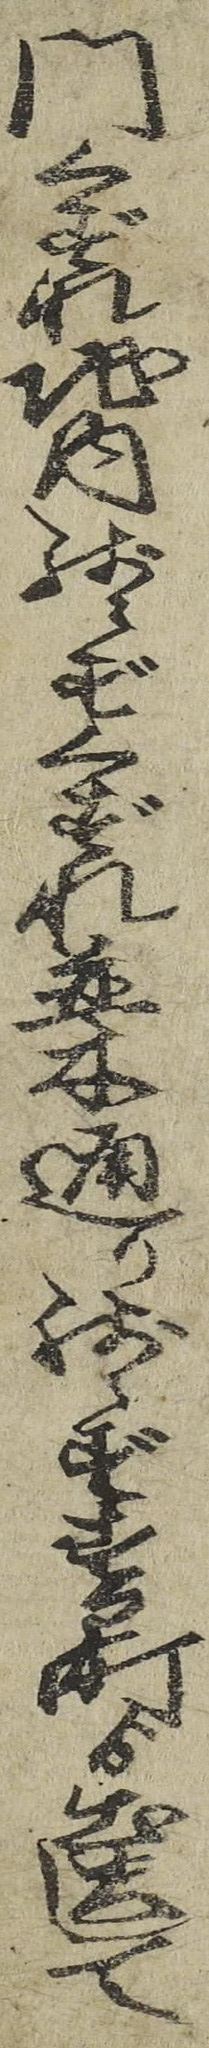門くずれ地内残らずくずれ並木通り残らずすわ町ゟ出火して
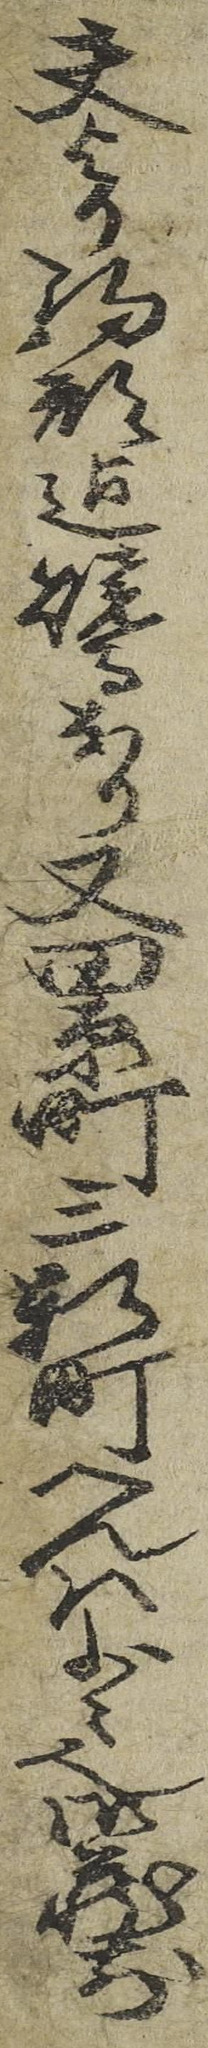夫より駒形迄焼るなり又田原町三軒町へんは少々也御蔵前

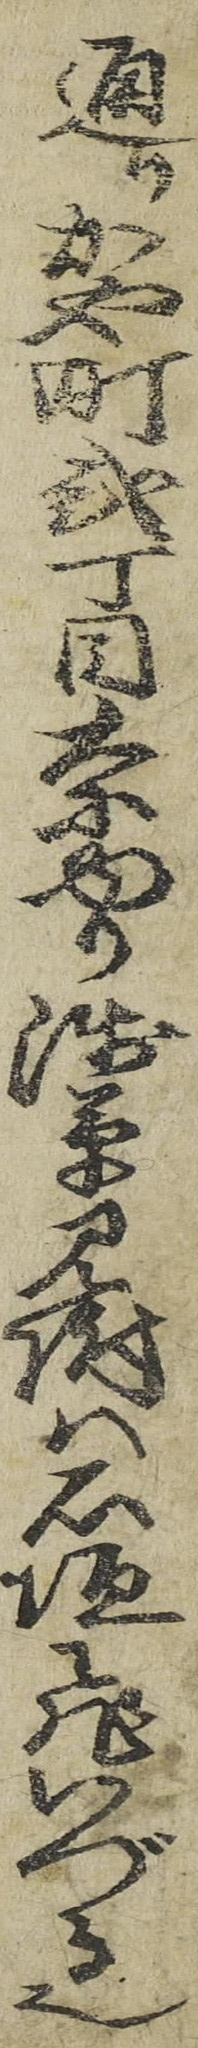通りかや町弐丁目大にゆり浅草見附は石垣飛いづる也
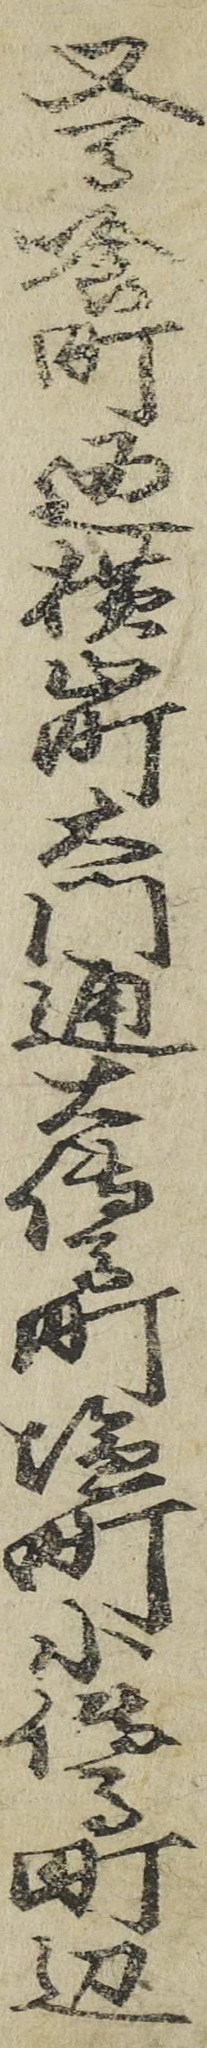又馬喰町辺横山町大門通大伝馬町塩町小傳馬町辺
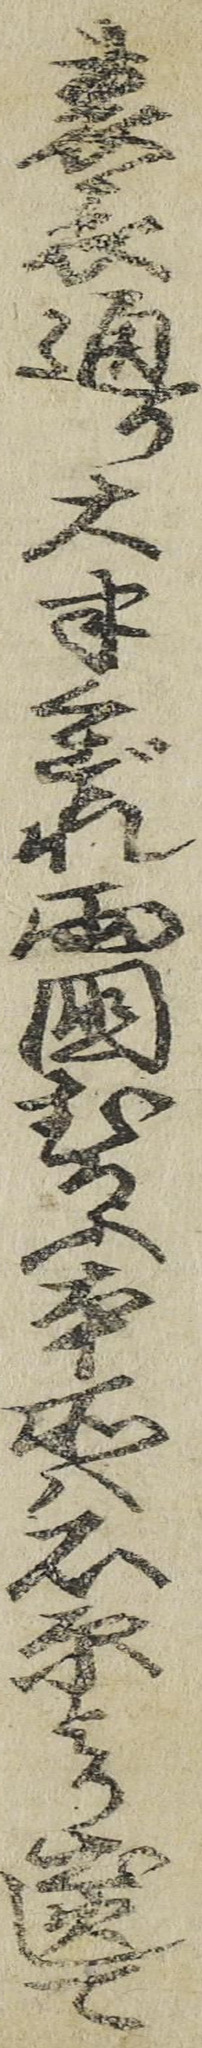裏表通り大半くずれ両国むかふ本所は石原より出火して
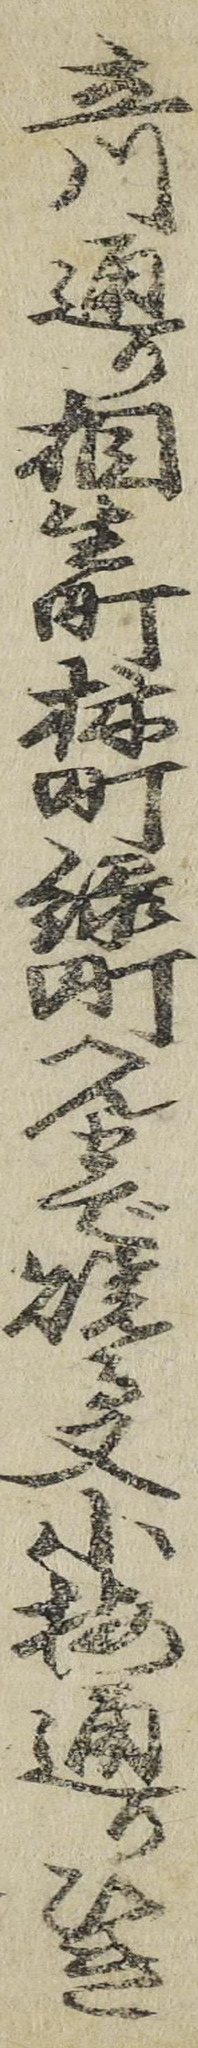立川通り相生町林町緑町へんまで焼る又小梅通りひき
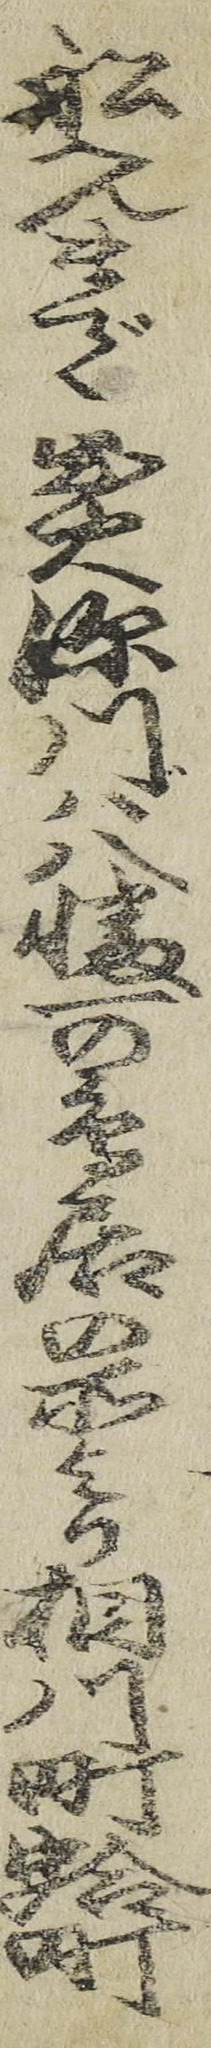船へんまで出火深川は八幡一の鳥居の所より相川町蛤町
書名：安政大地震畧記　全
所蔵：東京大学地震研究所図書室 Earthquake Research Institute Library, The University of Tokyo, JAPAN
